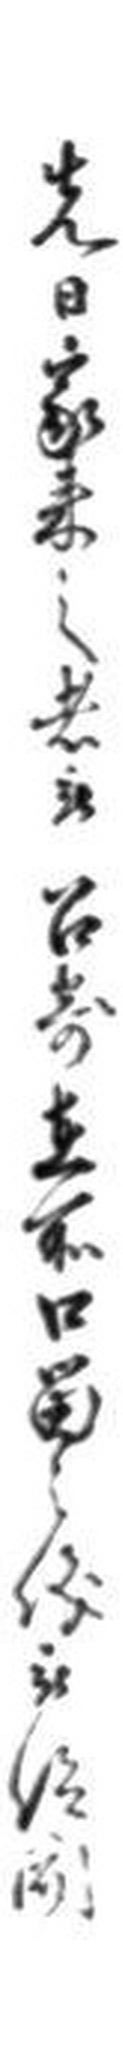先日家来之者被召寄在所口留之儀被仰聞
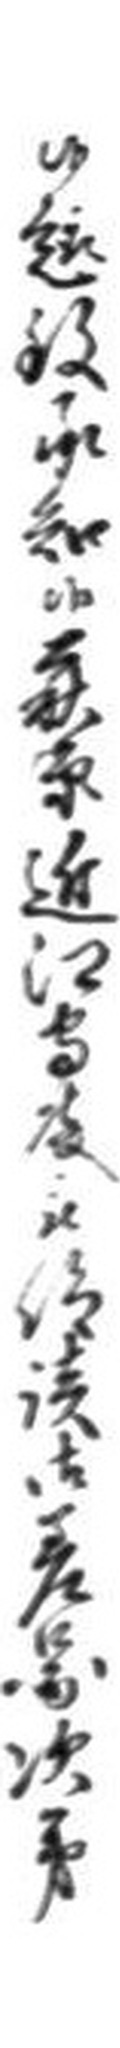候趣致承知候萩原近江守殿被仰談御差図次第
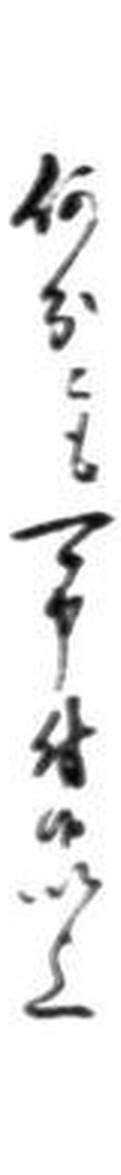何分ニも可申付候以上
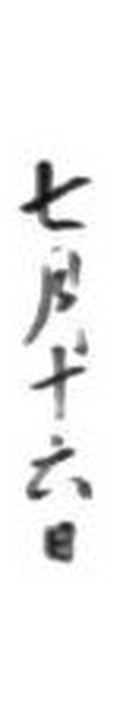七月十六日
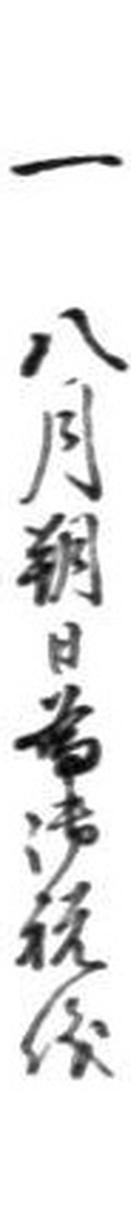一八月朔日為御祝儀
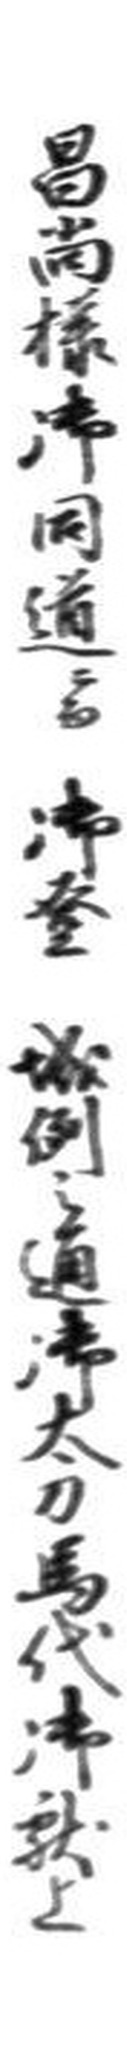昌尚様御同道ニ而御登城例之通御太刀馬代御献上
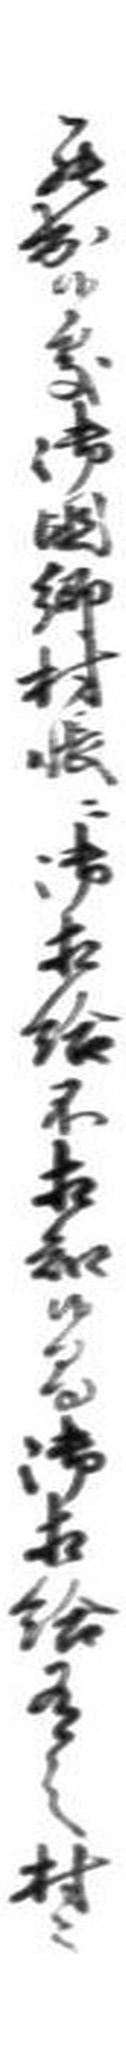罷出候処御国郷村帳ニ御相給不相知候間御相給有之村々
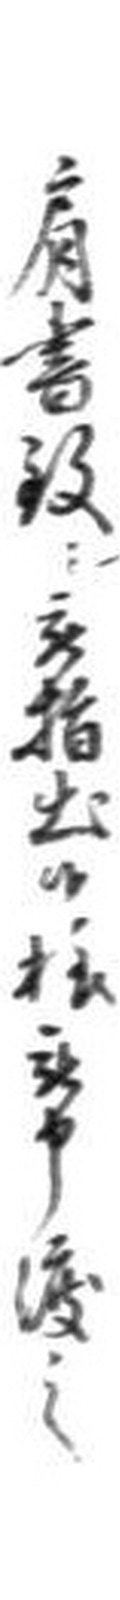肩書致シ被指出候様被申渡之
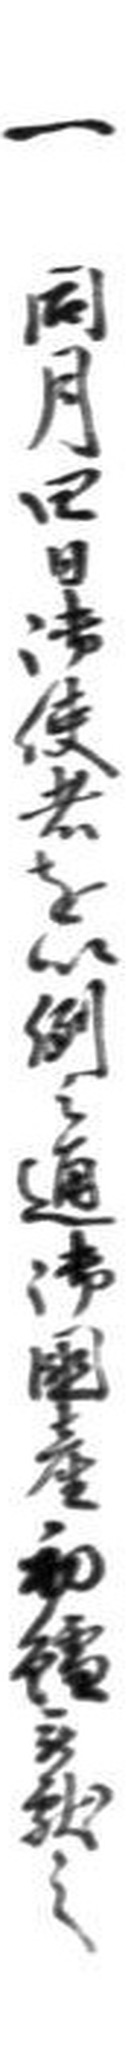一同月四日御使者を以例之通御国産初鱈被献之

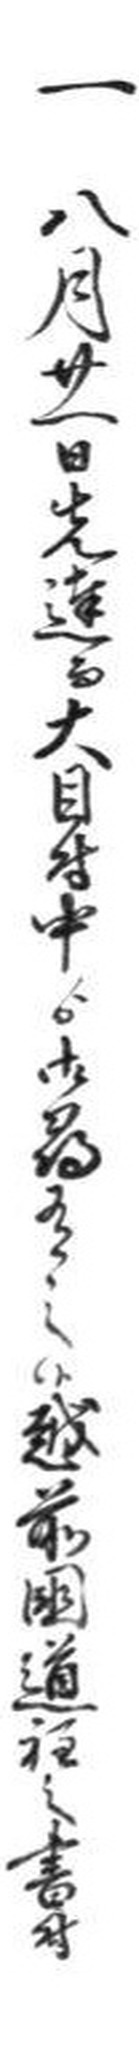一八月廿一日先達而大目付中ゟ御尋有之候越前国道程之書付
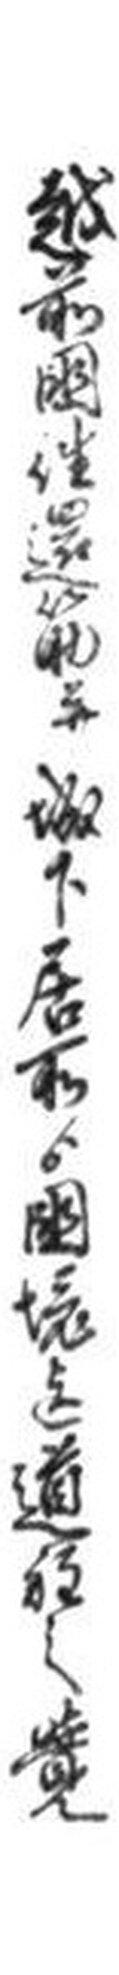越前国往還筋并城下居所ゟ国境迄道程之覚
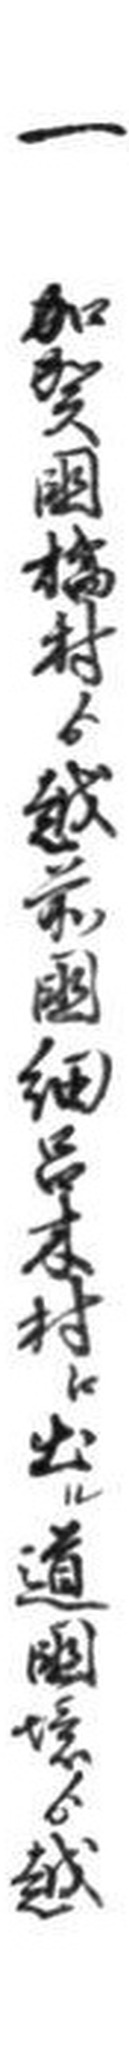一加賀国橘村ゟ越前国細呂木村江出ル道国境ゟ越
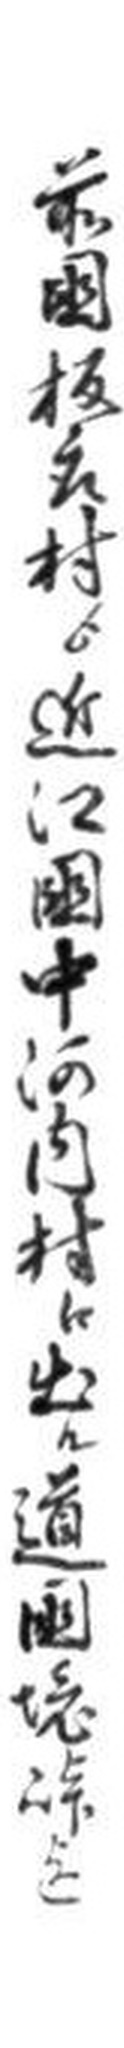前国板取村ゟ近江国中河内村江出ル道国境峠迄
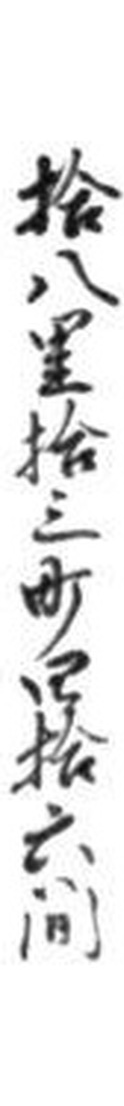拾八里拾三町四拾六間
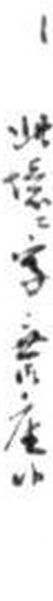此境ニ字無御座候
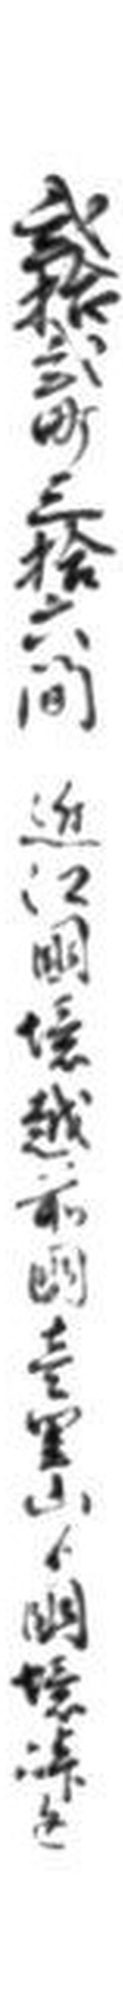弐拾弐町三拾六間近江国境越前国壱黒山ゟ国境峠迄
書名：家譜 二十二 吉品公 従元禄十五年到同十六年
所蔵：福井県文書館 Fukui Prefectural Archives
